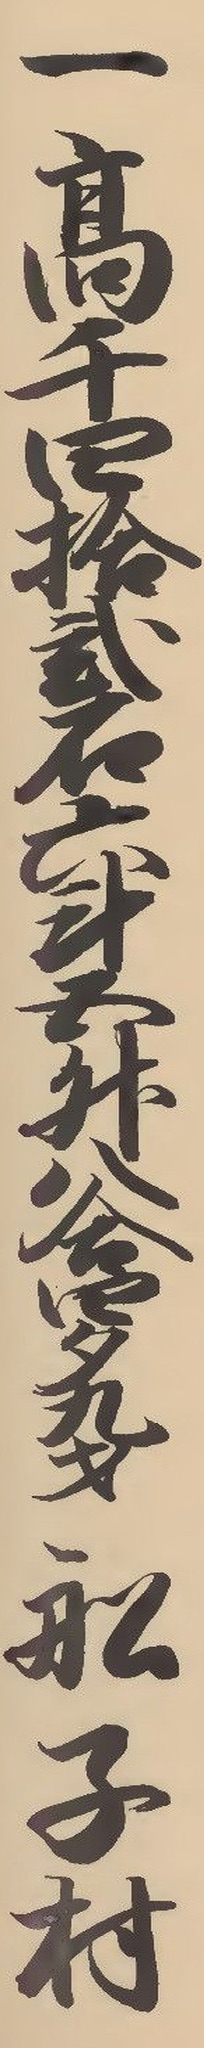一高千四拾弐石六斗五升八合四勺九才船子村
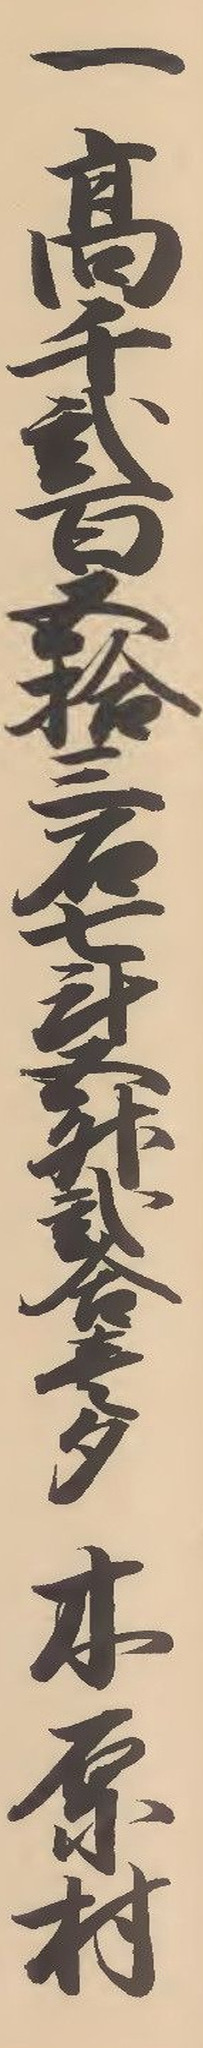一高千弐百五拾三石七斗五升弐合壱勺木原村
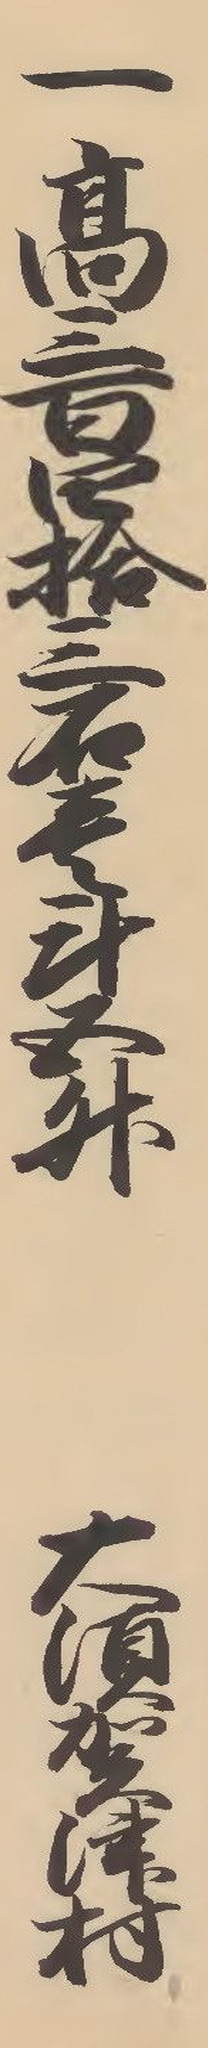一高三百四拾三石壱斗五升大須賀津村
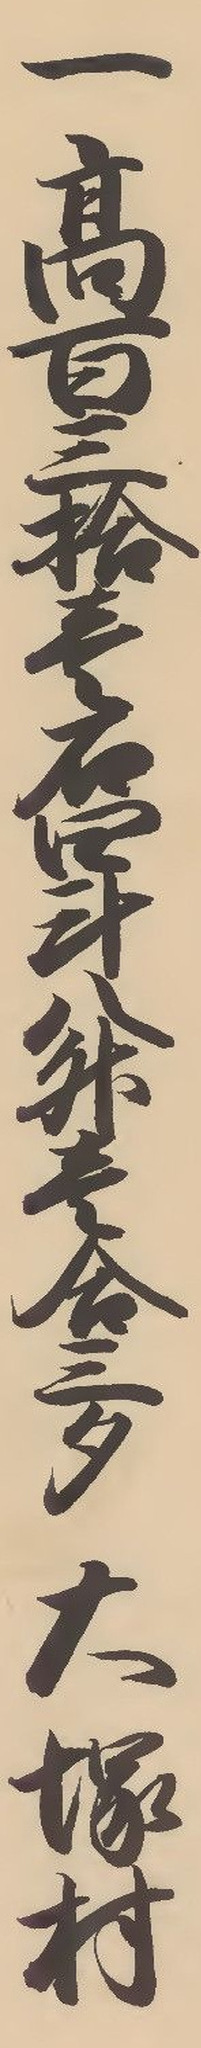一高百三拾壱石四斗八升壱合三勺大塚村
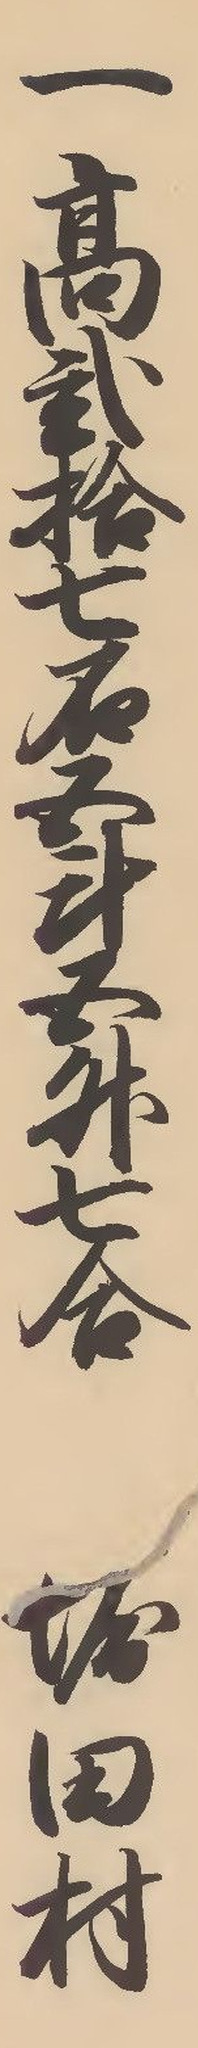一高弐拾七石五斗五升七合堀田村

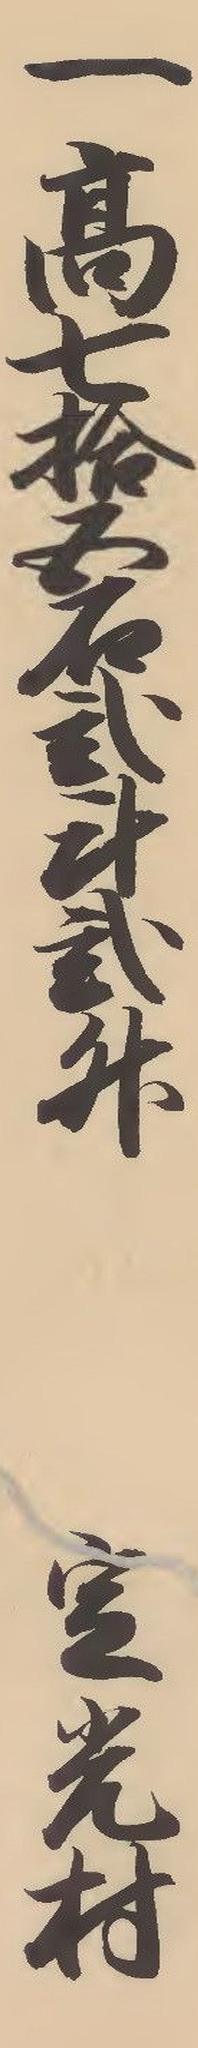一高七拾五石弐斗弐升定光村
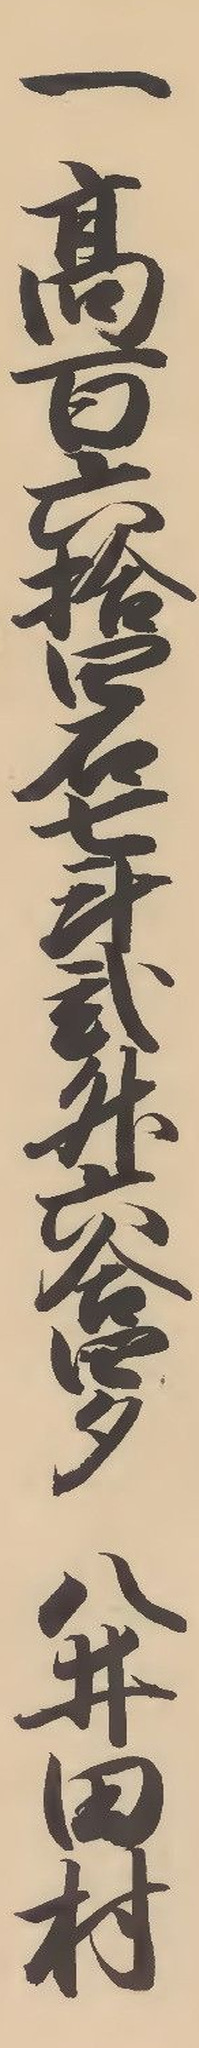一高百六拾四石七斗弐升六合四勺八井田村
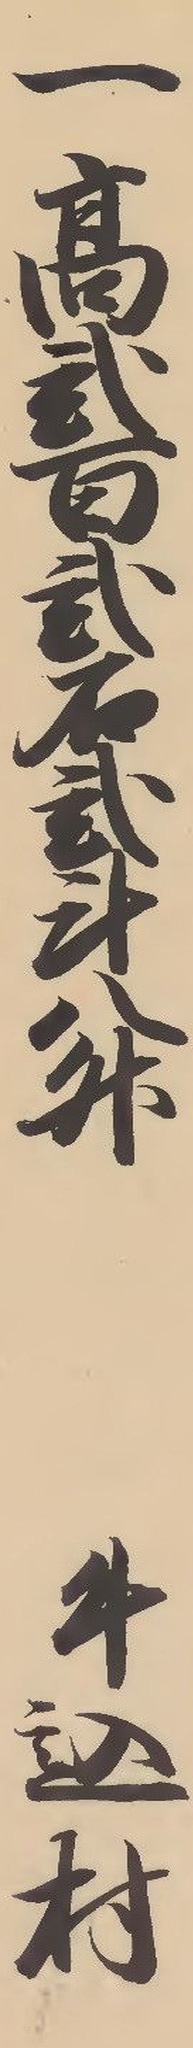一高弐百弐石弐斗八升牛込村
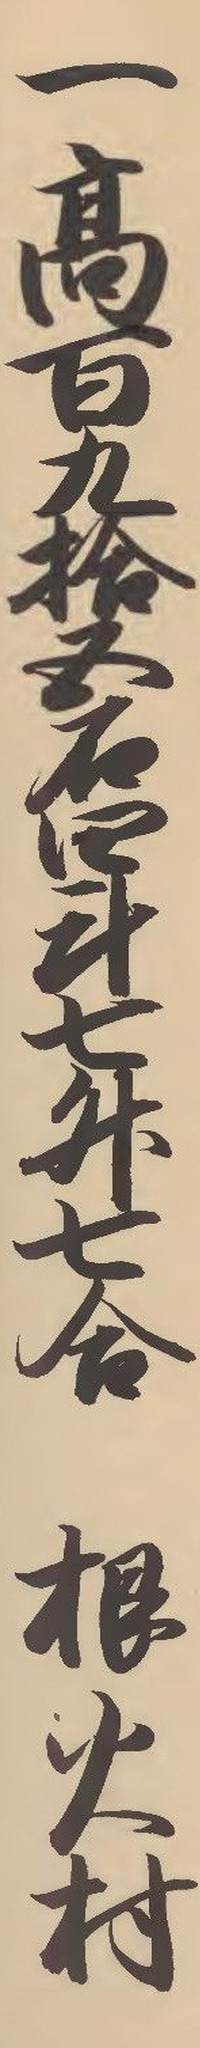一高百九拾五石四斗七升七合根火村
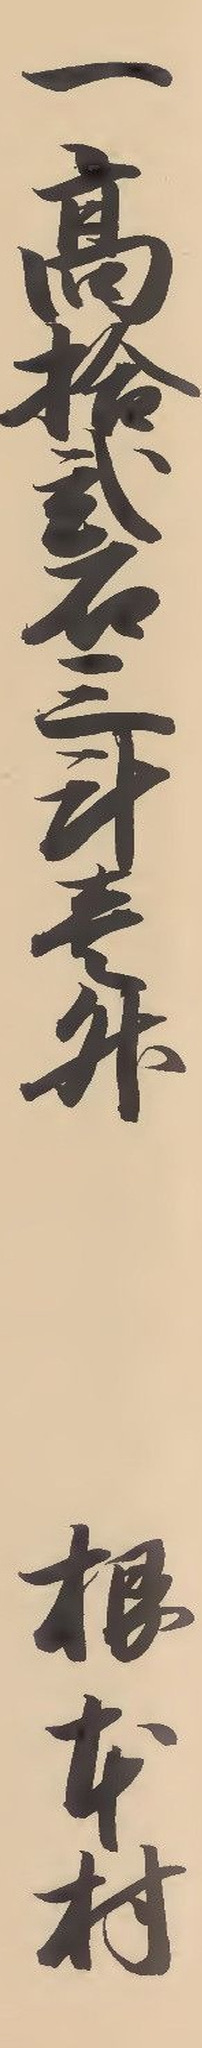一高拾弐石三斗壱升根本村
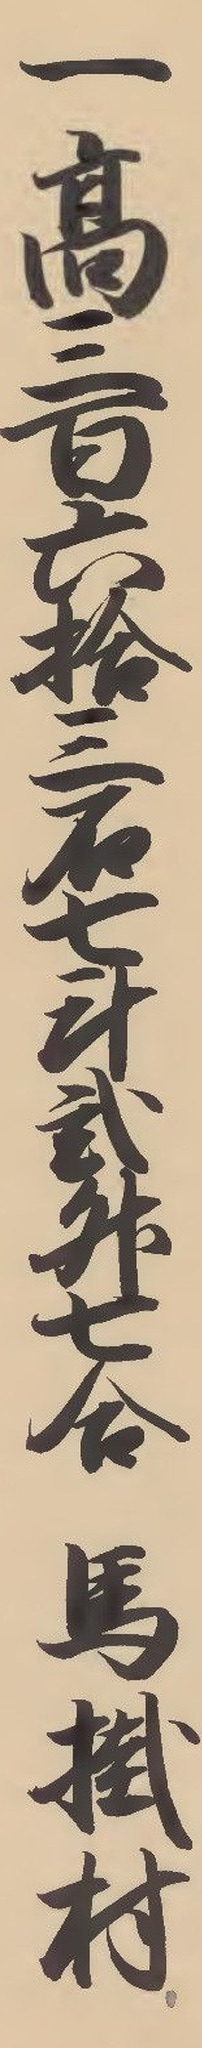一高三百六拾三石七斗弐升七合馬掛村
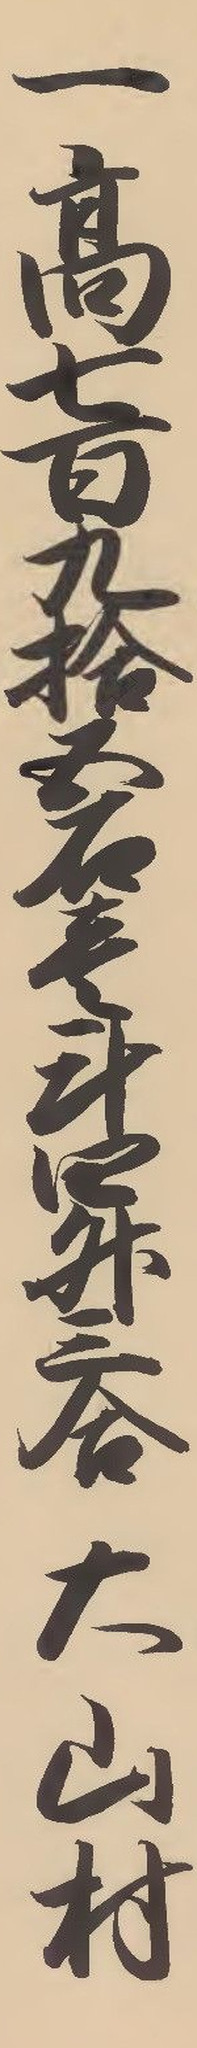一高七百九拾五石壱斗四升三合大山村
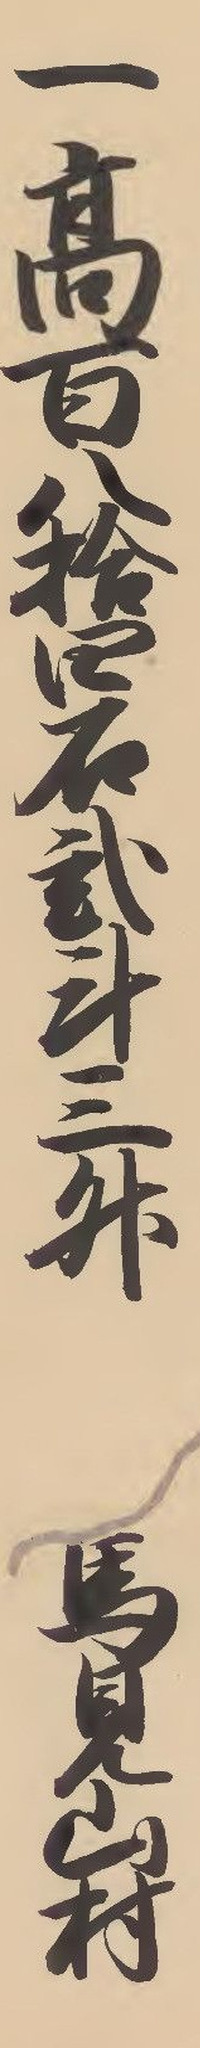一高百八拾四石弐斗三升馬見山村

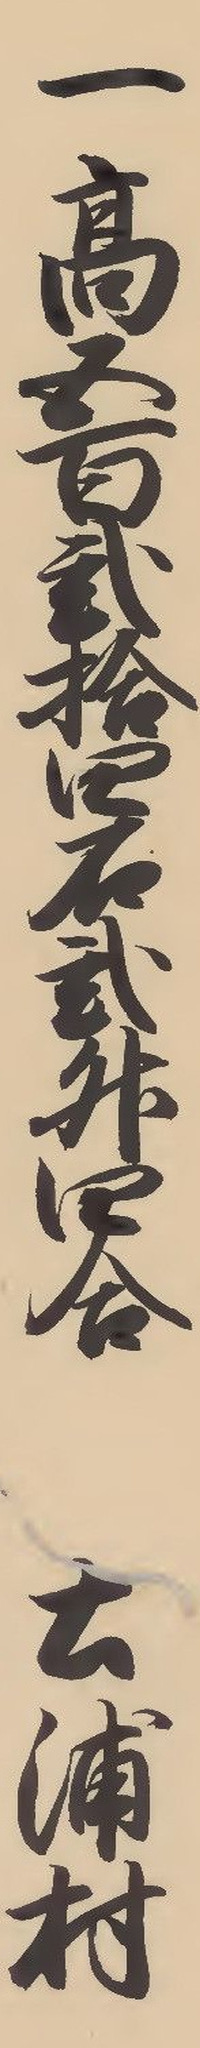一高五百弐拾四石弐升四合土浦村
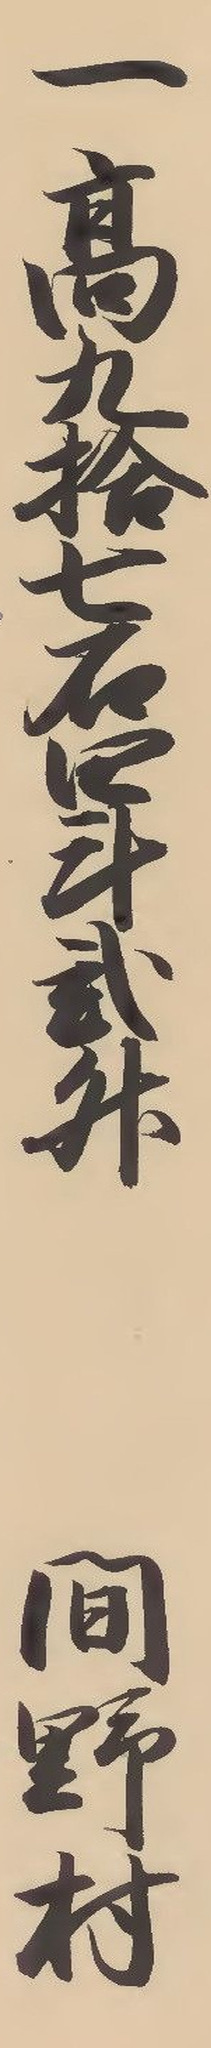一高九拾七石四斗弐升間野村
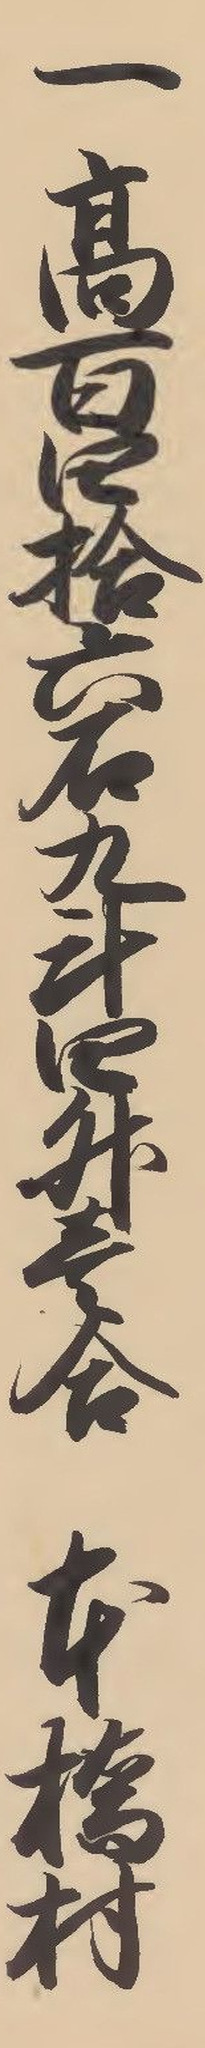一高百四拾六石九斗四升壱合本橋村
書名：常陸国郷帳
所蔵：国立公文書館 National Archives of Japan
